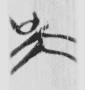吳
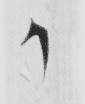人
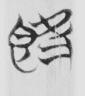既
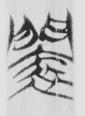{門衣衣}
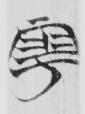𩁹
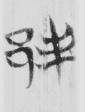邦
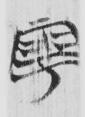𩁹
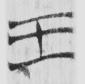王
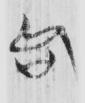句
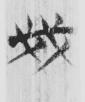{戈戈}
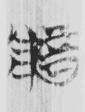𨟻
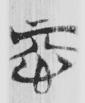{亓心}
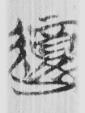復
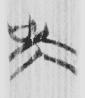吳
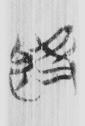既
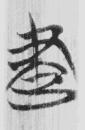{聿止}
